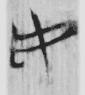女
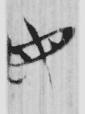母
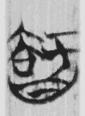智
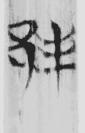邦
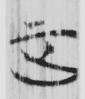正
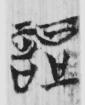{言豆}
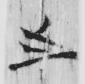之
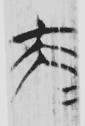夫=
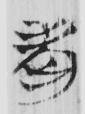老
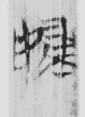婦
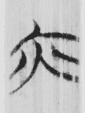亦
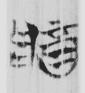𨟻
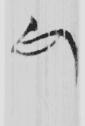丩
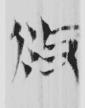攸
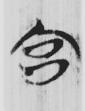宮
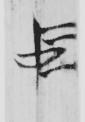𠁩
